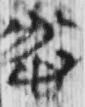忿
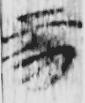亥
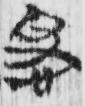快
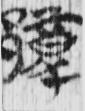○（复）
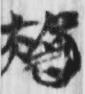○（胡）
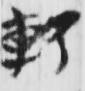○（範）
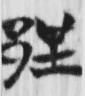郢
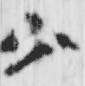少
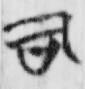司
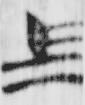馬
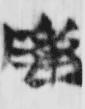○（陳）
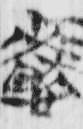憖
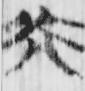癸
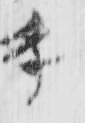丑
